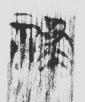{衣聿}
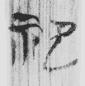祀
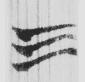三
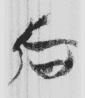后
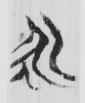永
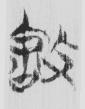{余口攴}
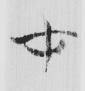才
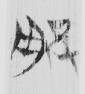服
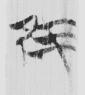隹
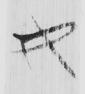女
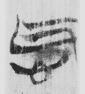怠
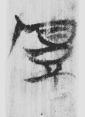厚
